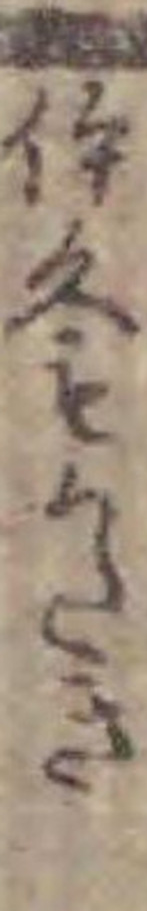伊久もかたき
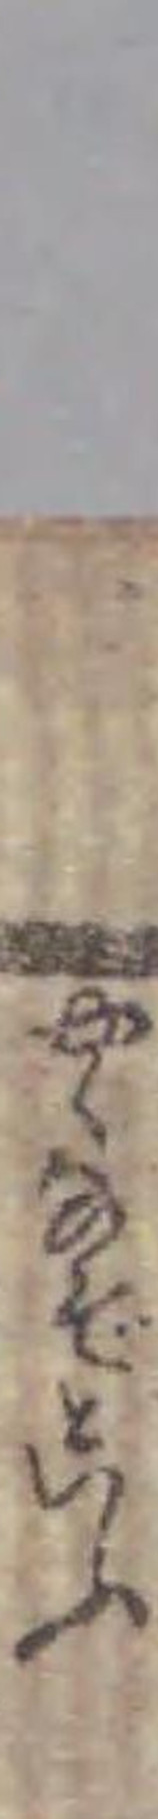やくなぞといふ
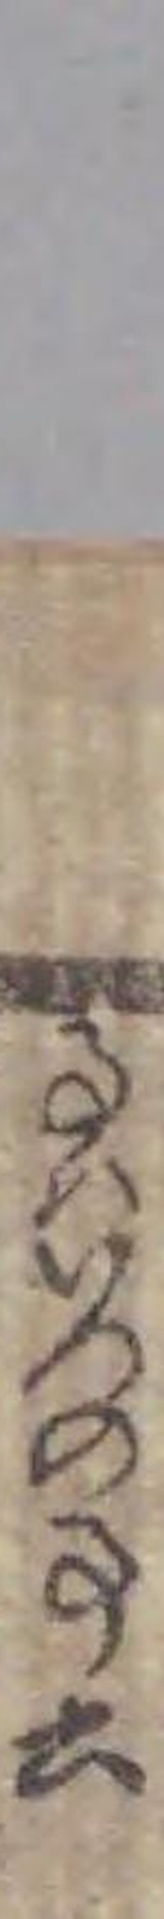事はいつの事六
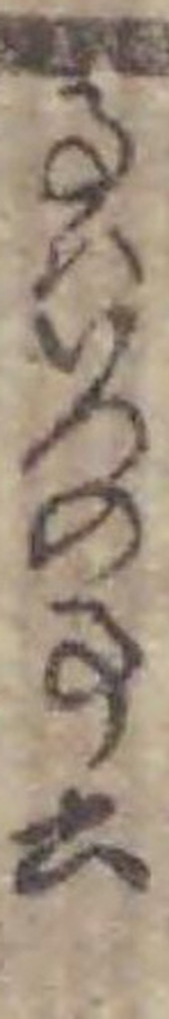事はいつの事六
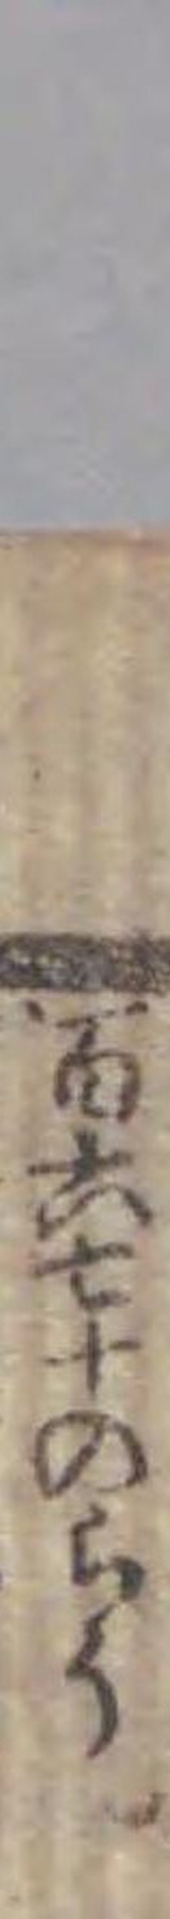百六七十のらう
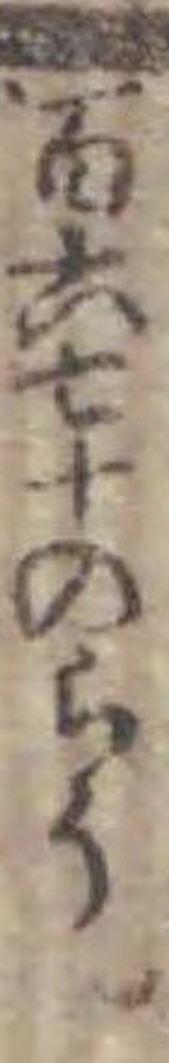百六七十のらう
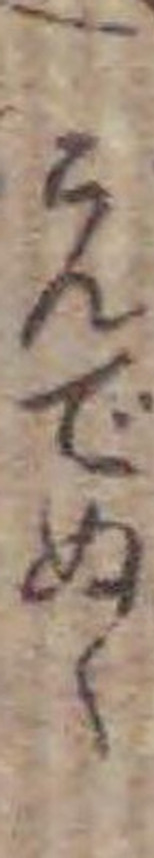こんでぬく
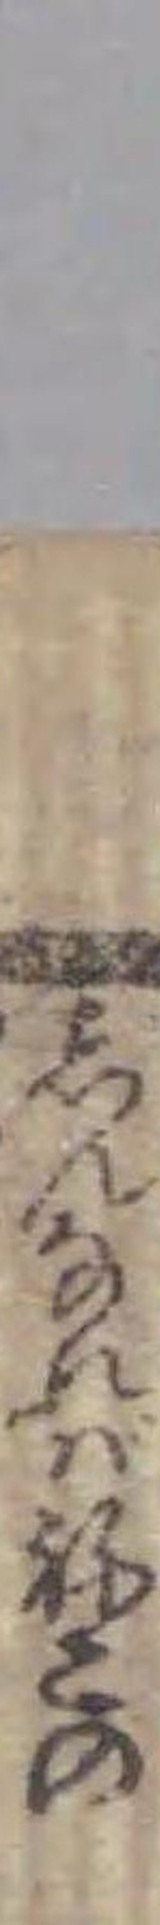しんなればねこの
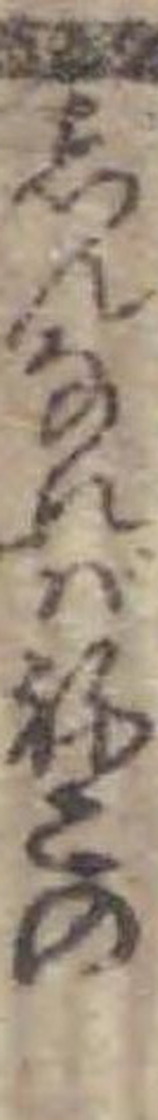しんなればねこの
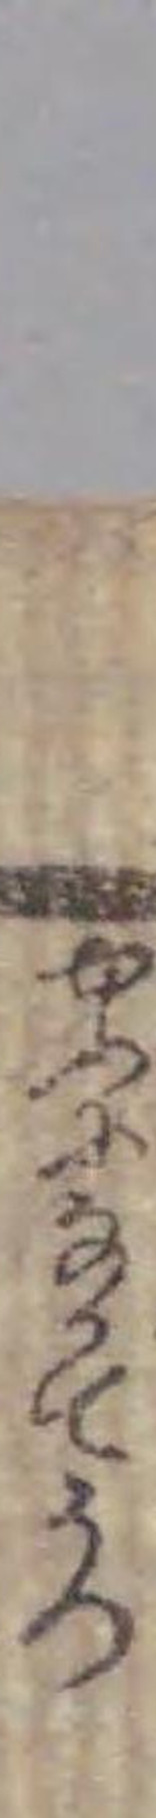やふになりてうつ
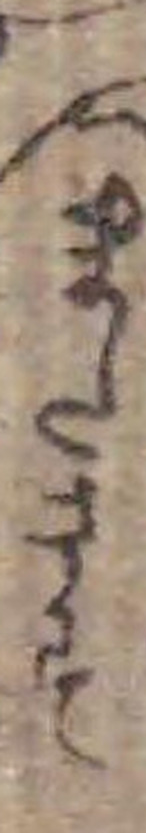またさす
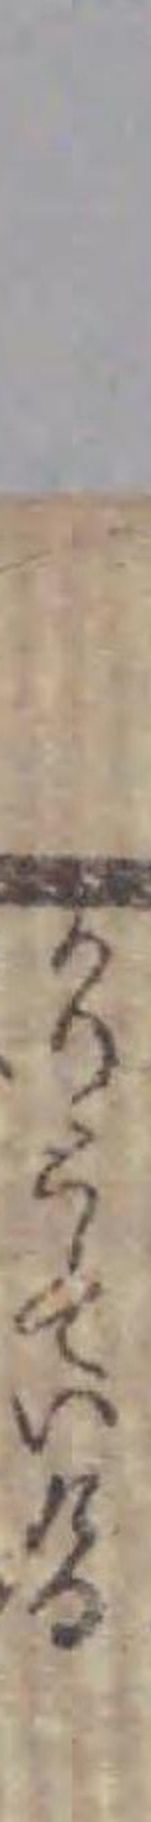かりとしていける
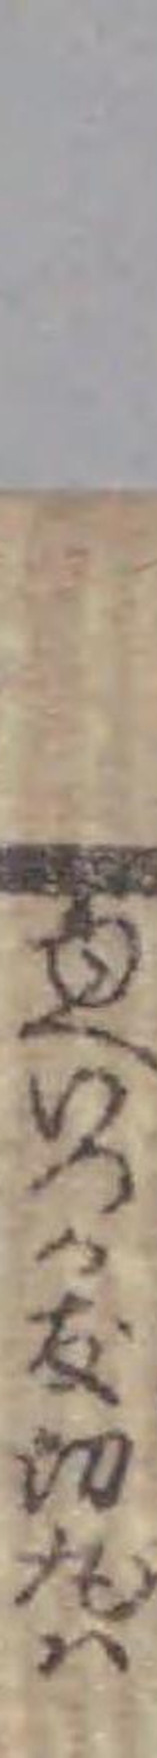ゆへいつか友切丸は
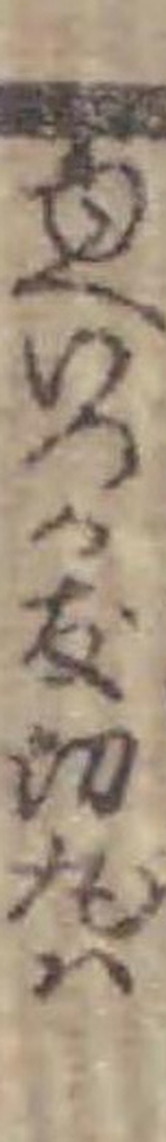ゆへいつか友切丸は
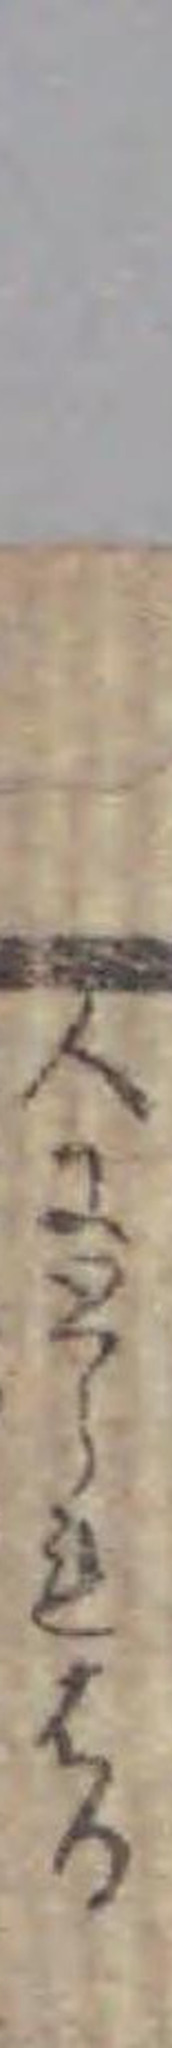人にとられはり
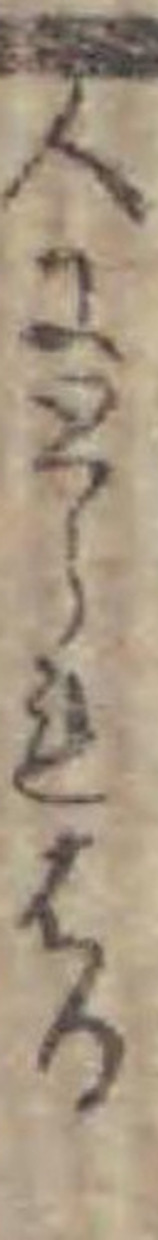人にとられはり
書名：年寄之冷水曽我 : 3巻
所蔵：国立国会図書館 National Diet Library, JAPAN
